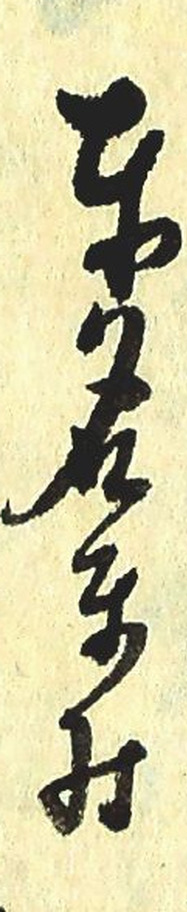東名東村
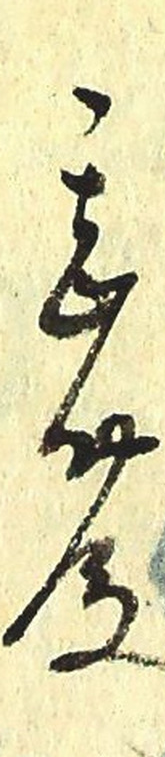甚助殿
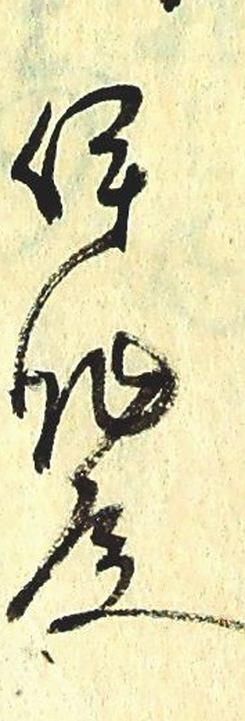伊作殿
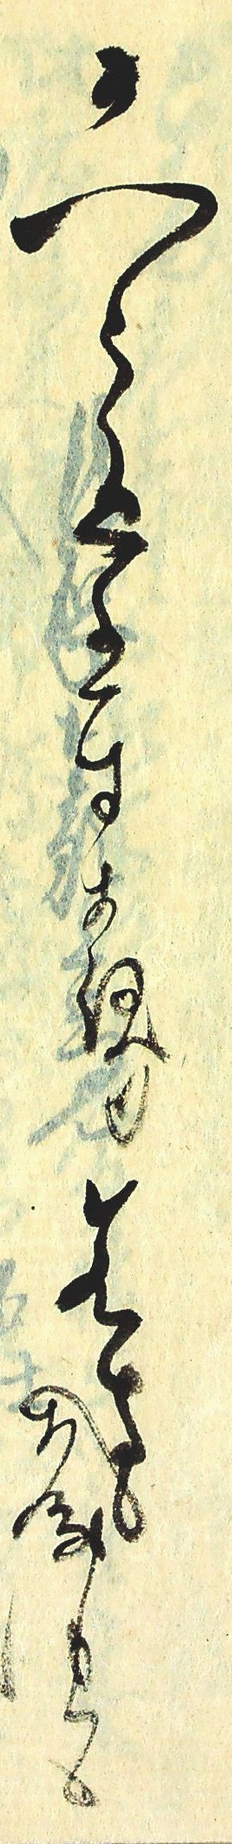右之通書付相認め先方へ相渡置候
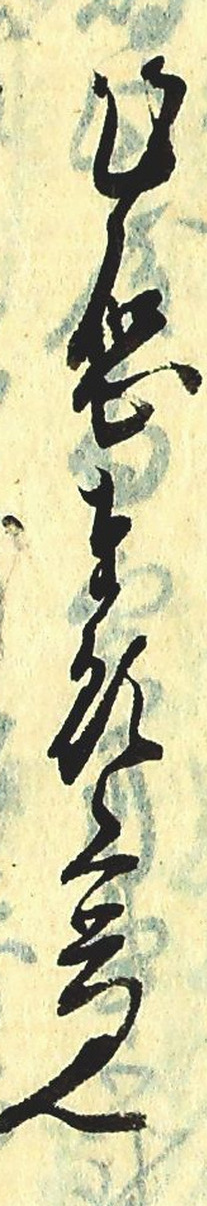乍恐奉願上覚
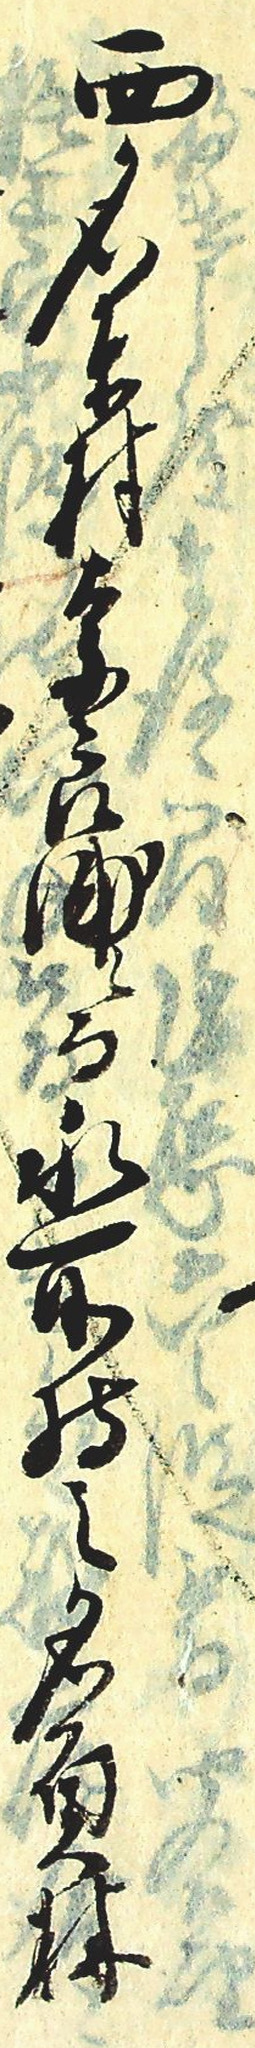西名東村奈良浦にて私所持之名負林
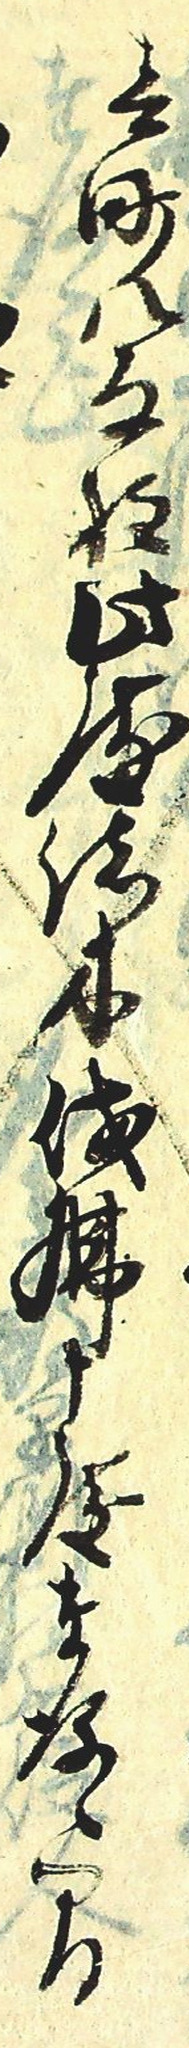壱町八反程此度諸木伐払申度奉存候間
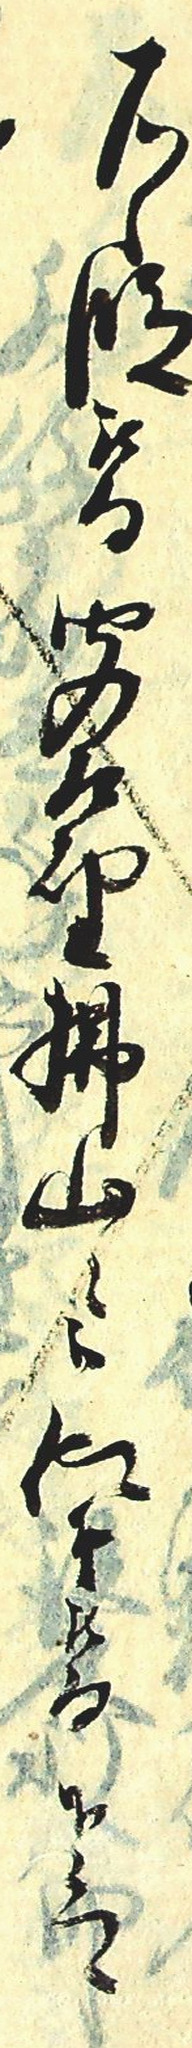右之段被為聞召届払山に被仰付被為下候はゝ
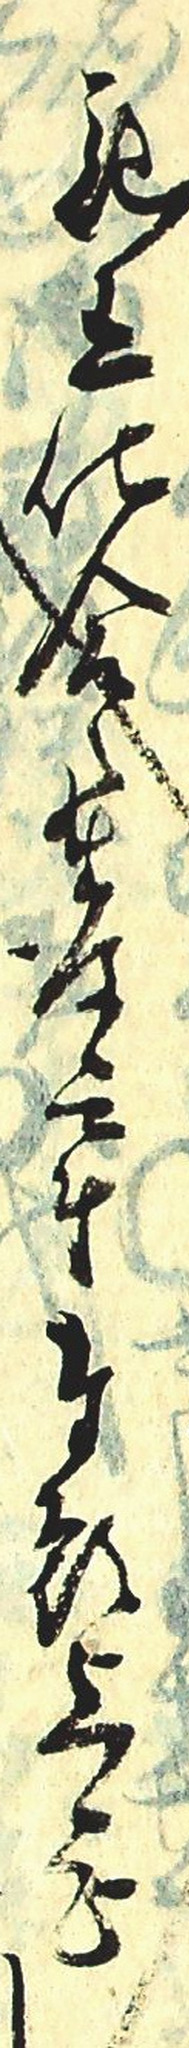難有仕合に奉存候に付奉願上候以上

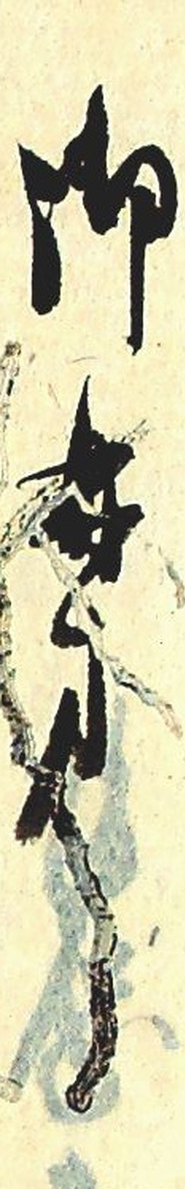御林方
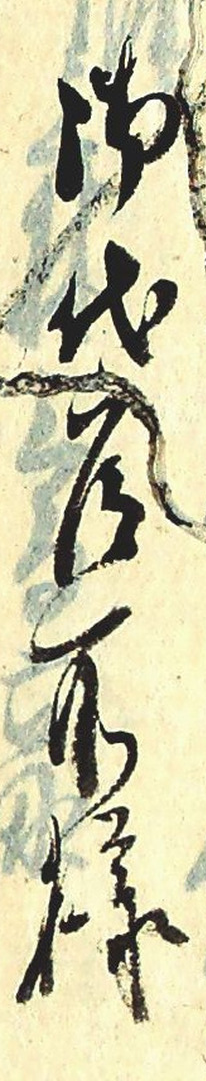御代官所様
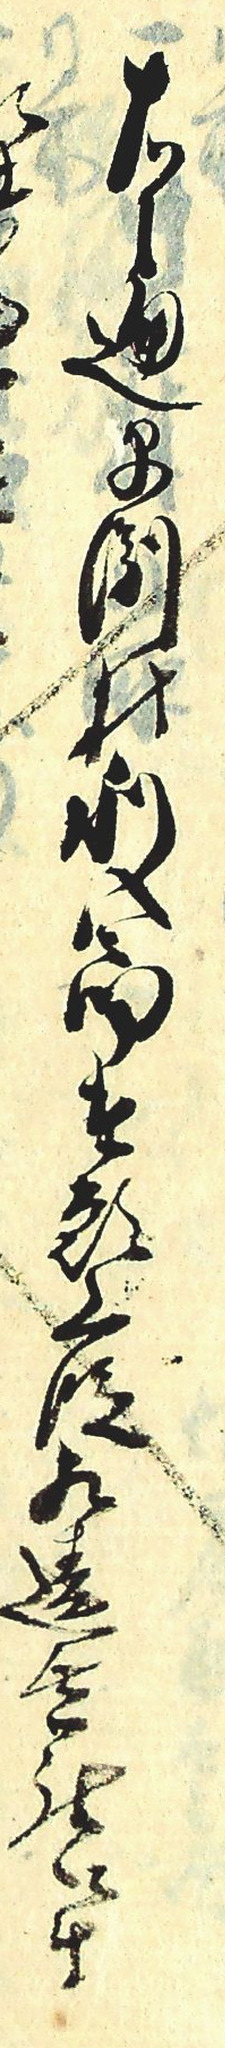右之通早淵村利八郎奉願上段相違無御座候に付
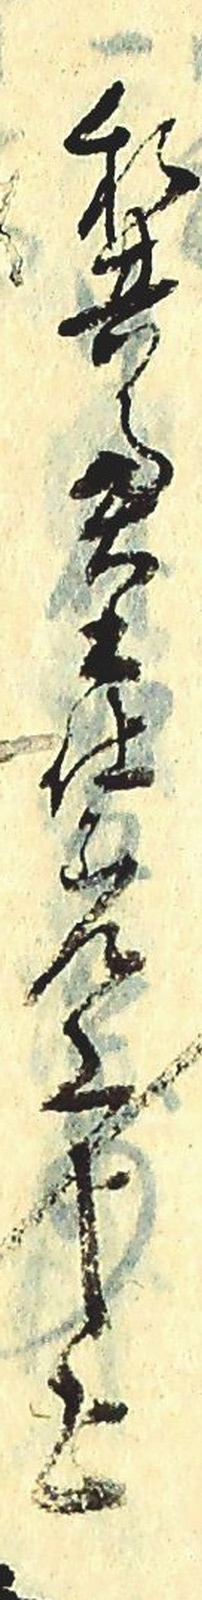私共奥書仕差上申候以上
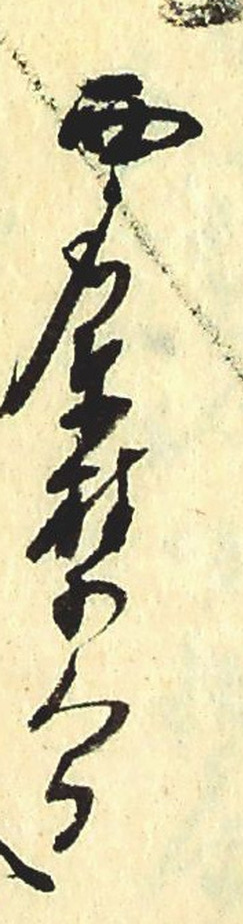西名東村五人与
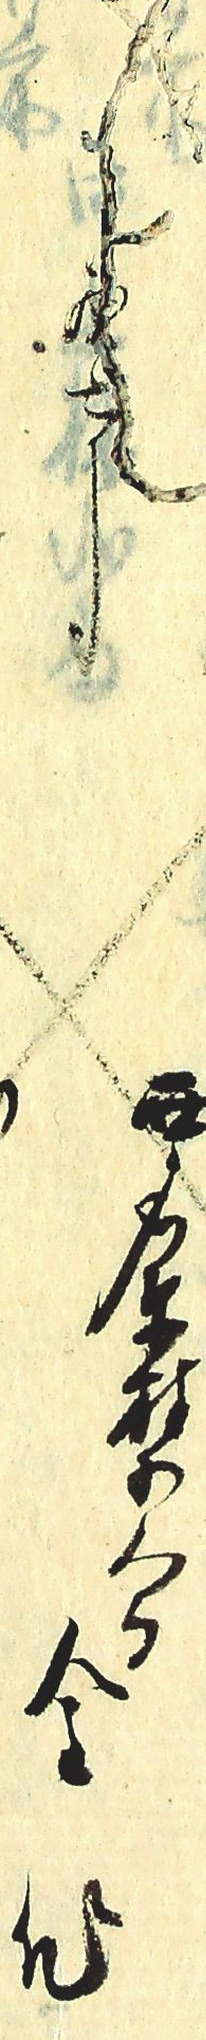西名東村五人与
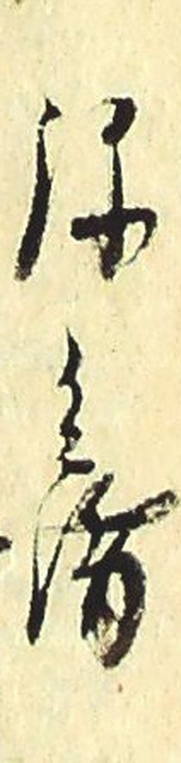同弥兵衛
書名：諸御願書控(弐番）
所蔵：鳴門教育大学 Naruto University of Education
